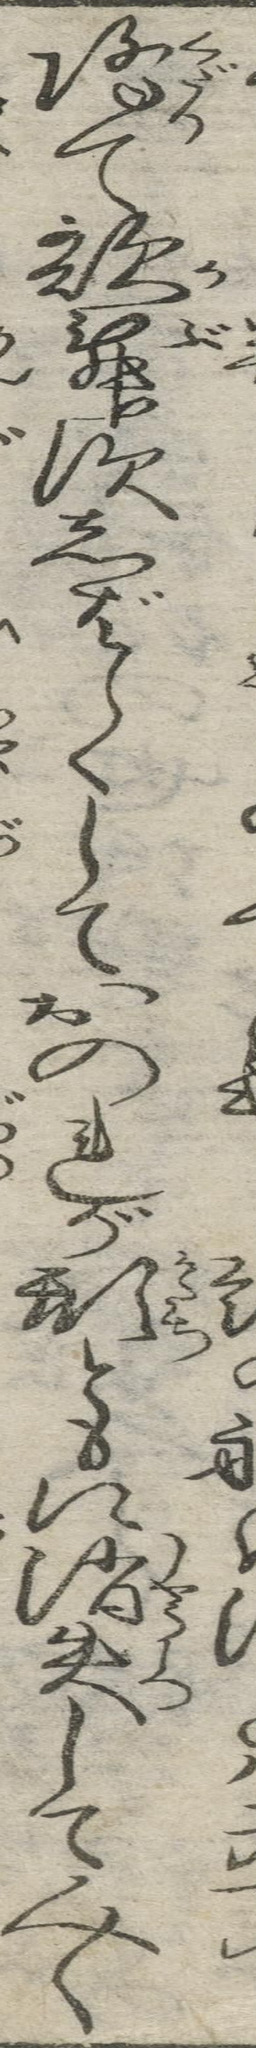降て歌舞すしばらくしておのれが形ともに消失して人〳〵
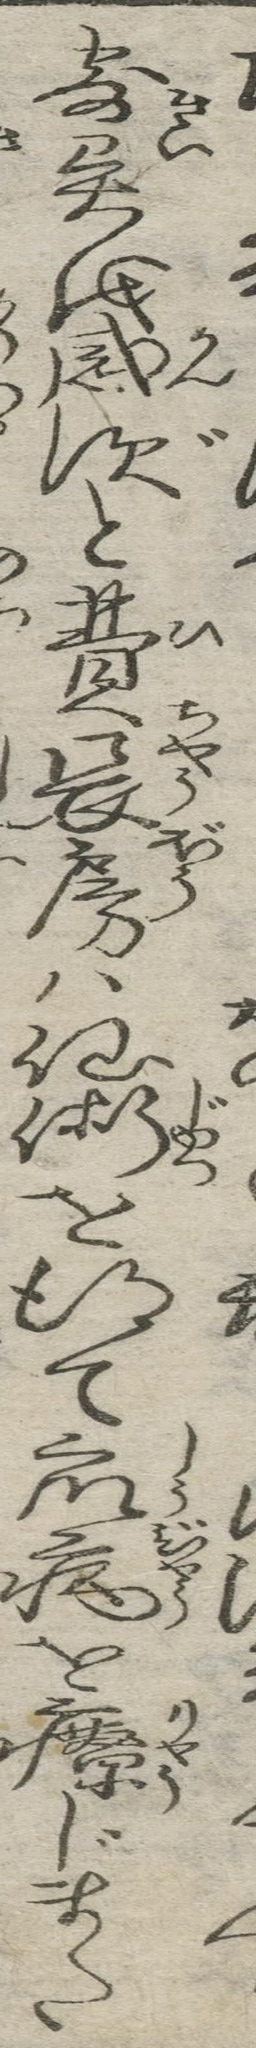奇異を感ずと費長房は仙術を得て衆病を療じまた
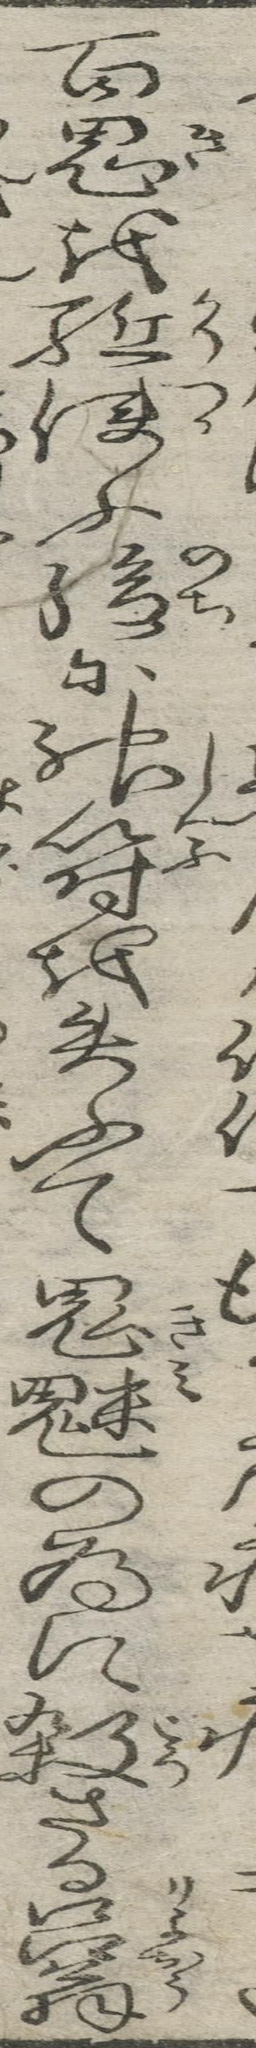百鬼を駈使ふ後に神符を失ふて鬼魅の為に殺さる呂翁
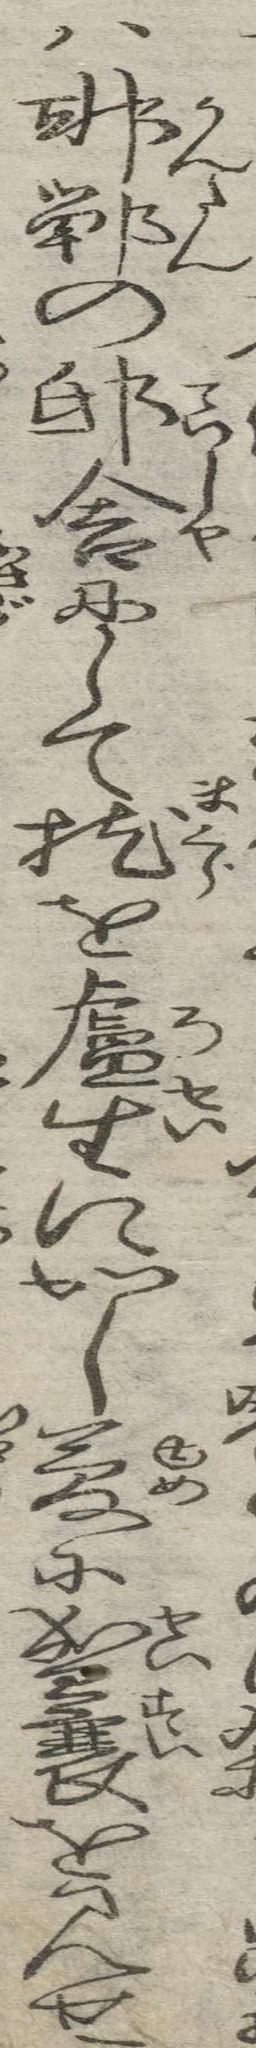は邯鄲の邸舎にして枕を盧生にかし夢に盛衰を見せ
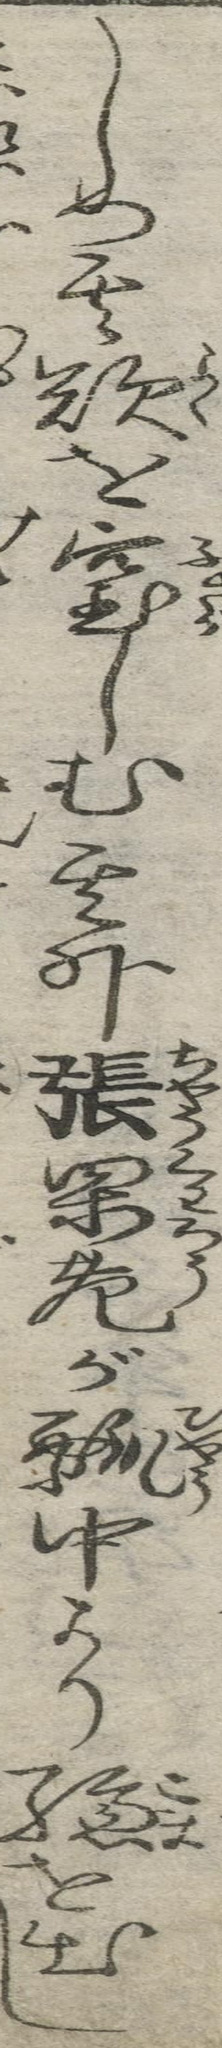しめ其欲を塞しむ其外張果老が瓢中より驢を出し
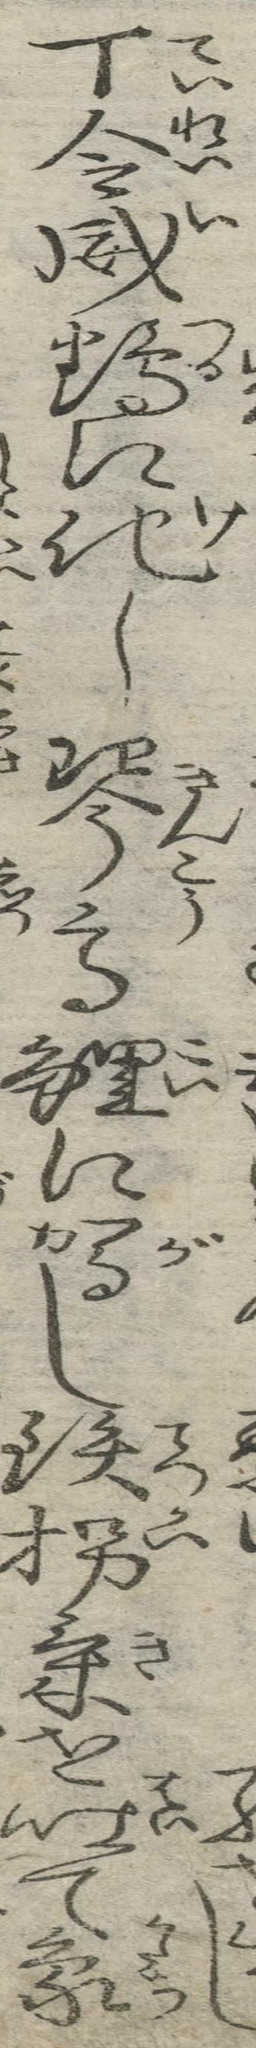丁令威鶴に化し琴高鯉に駕し鉄拐気を吐て象
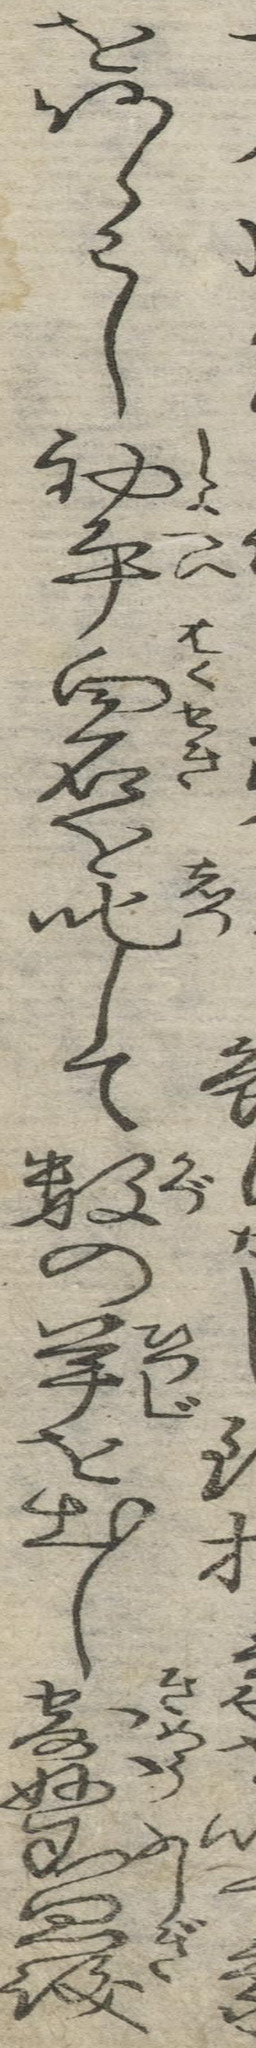をあらわし初平白石を叱して数の羊を出し奇妙不思議

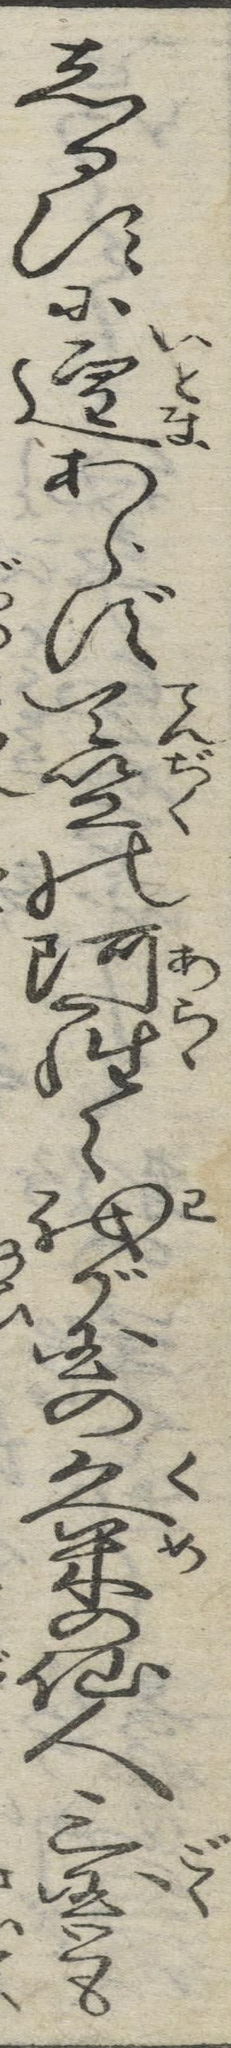しるすに遑あらず天竺の阿羅々我が国の久米の仙人三国とも
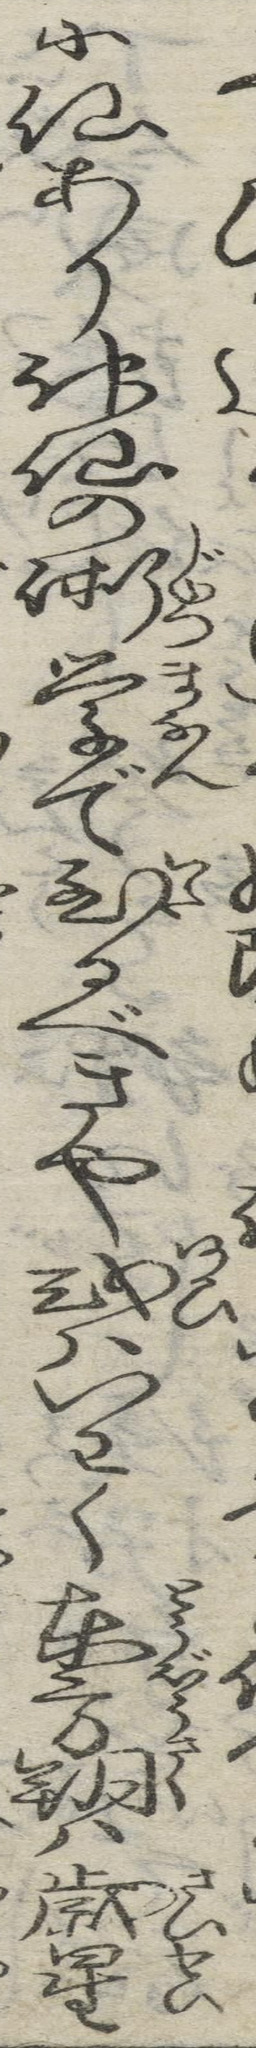に仙あり神仙の術学で至るべきや或はいわく東方朔は歳星
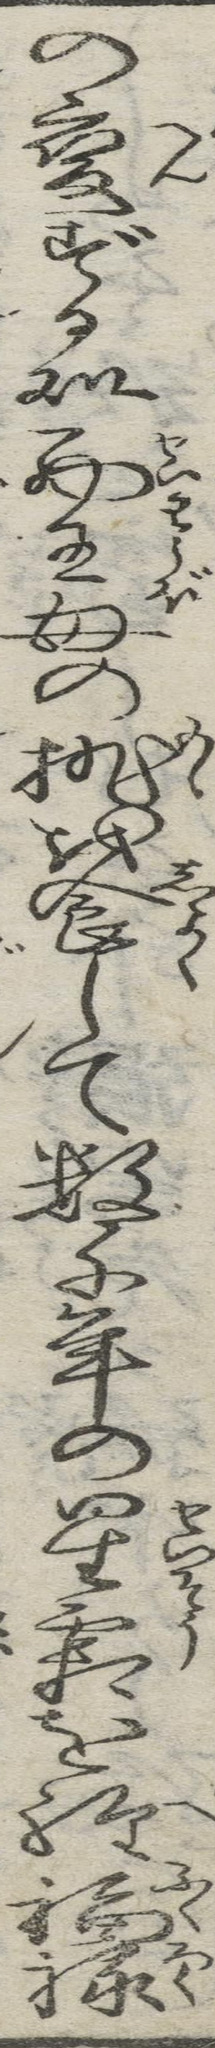の変ずる故西王母の桃を食して数千年の星霜を経福禄
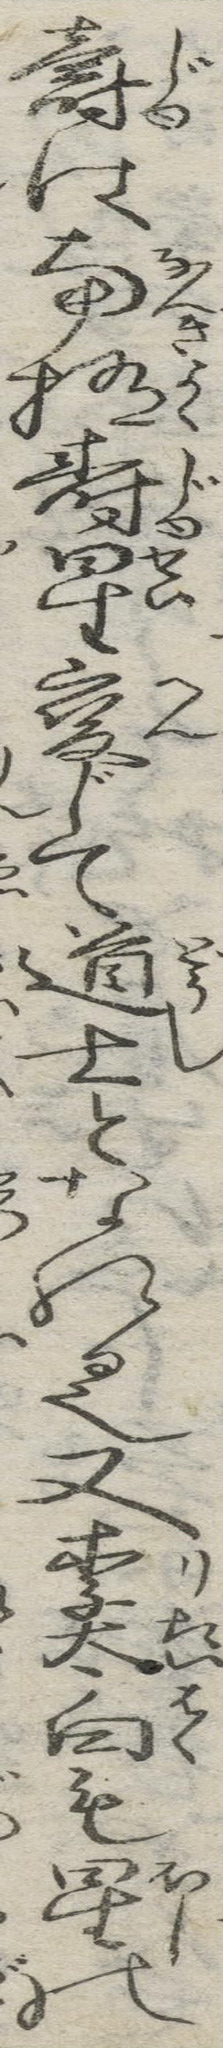壽は南極壽星変じて道士となれる也又李太白も星の
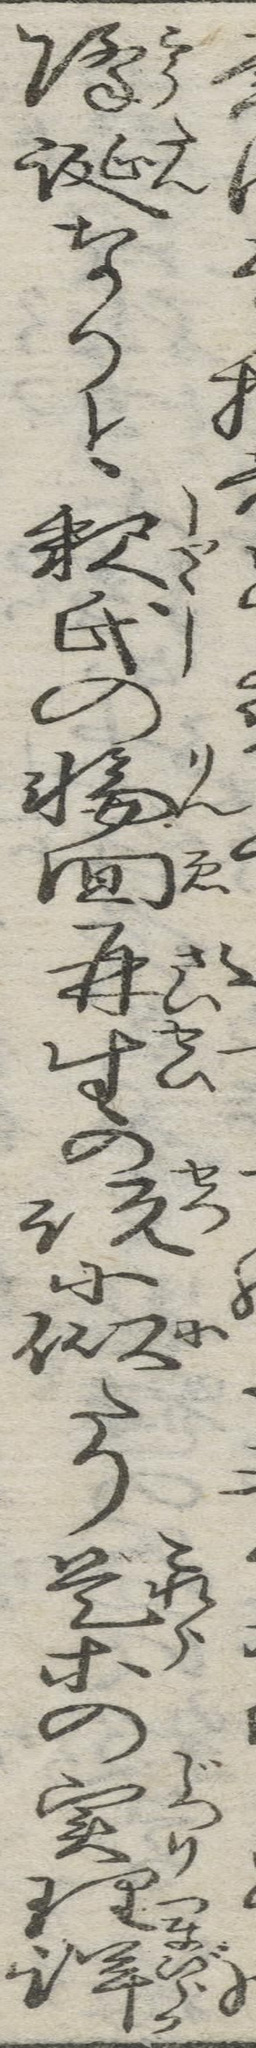降誕なりと釈氏の輪廻再生の説に似たり是等の実利詳
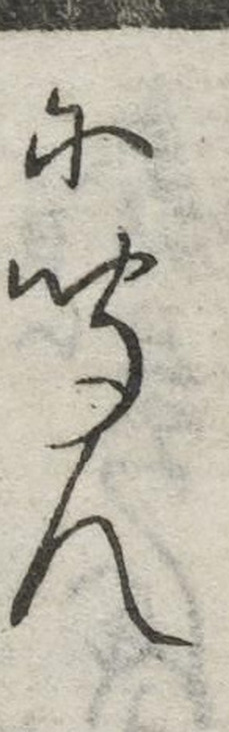に聞ん
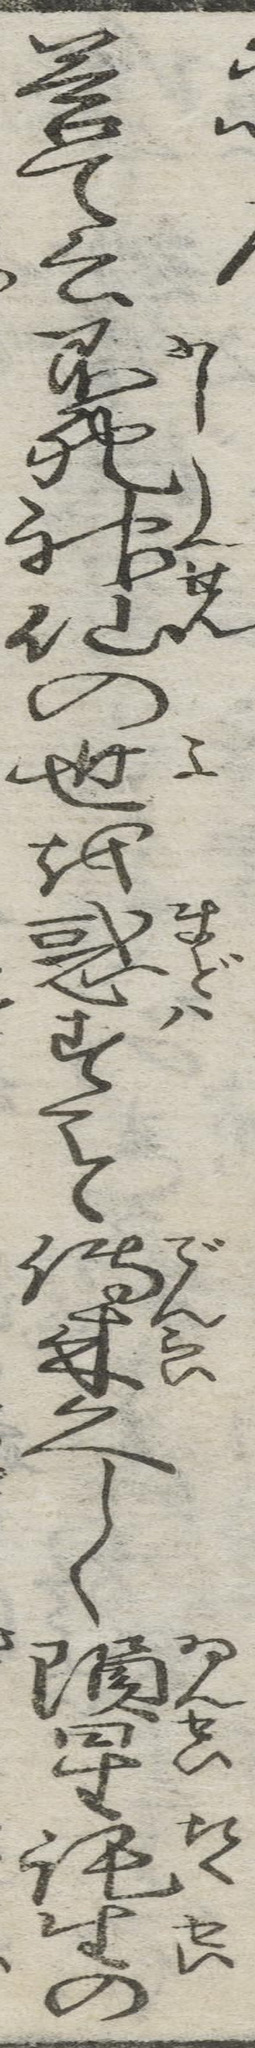答て云不死神仙の世を惑すこと傳来久しく隕星託生の
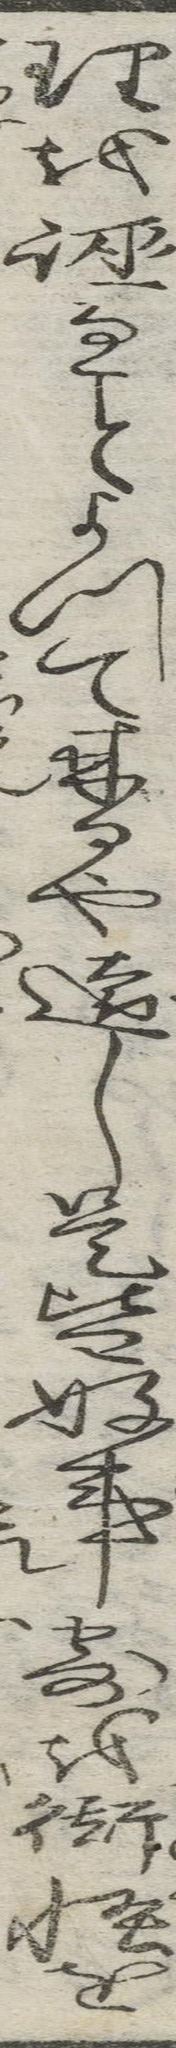理を誣ることよつて来るや遠し是皆好事奇を衒怪を
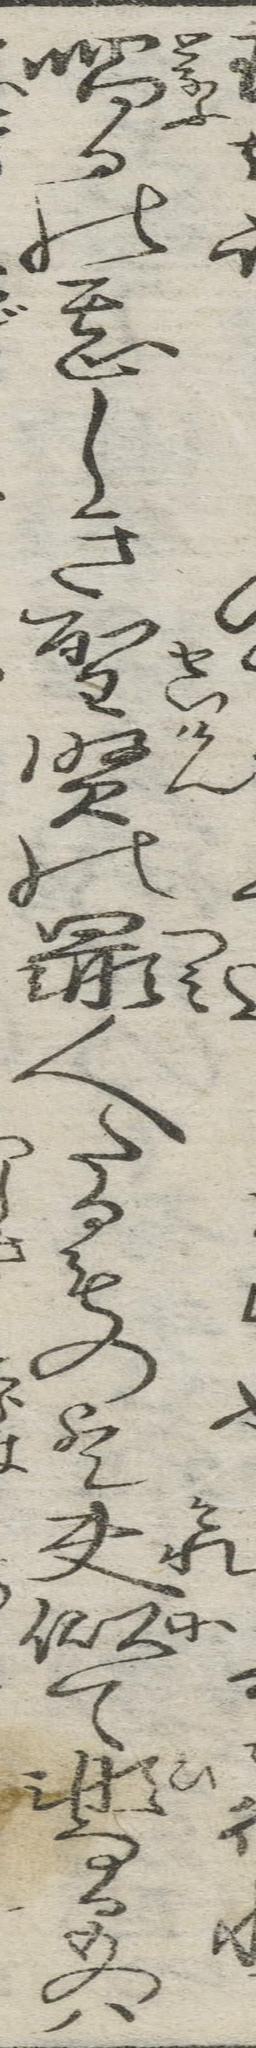唱るの甚しき聖賢の罪人たるもの夫似て非なるものは
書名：訓蒙天地辨　人
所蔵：東京大学地震研究所図書室 Earthquake Research Institute Library, The University of Tokyo, JAPAN
